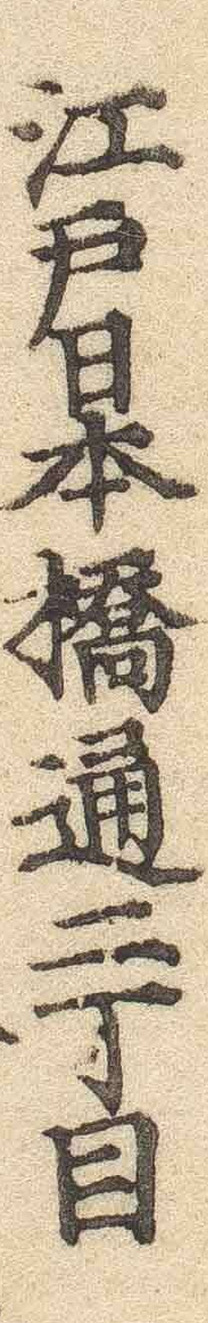江戸日本橋通二丁目
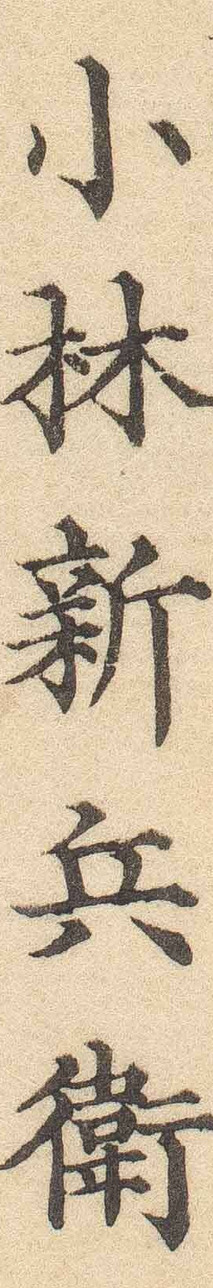小林新兵衛
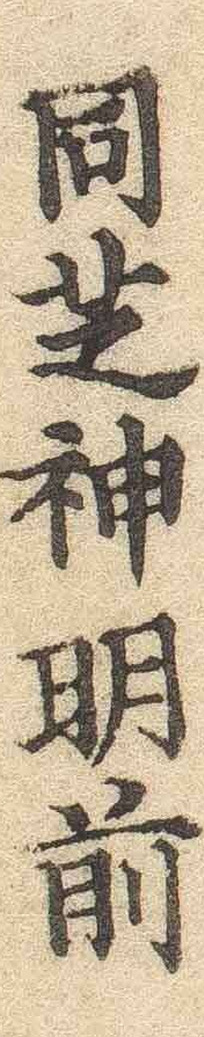同芝明神前
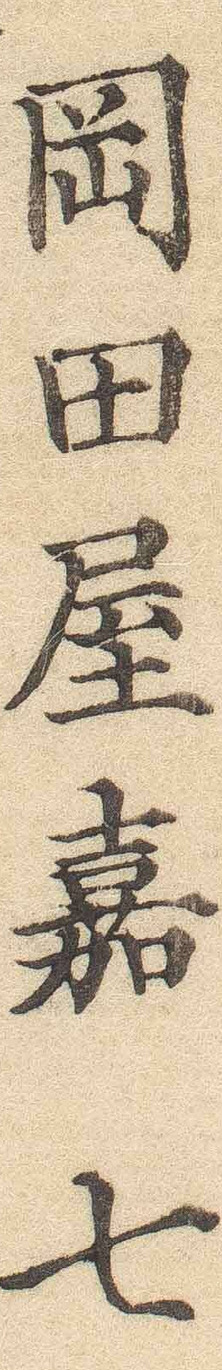岡田屋嘉七
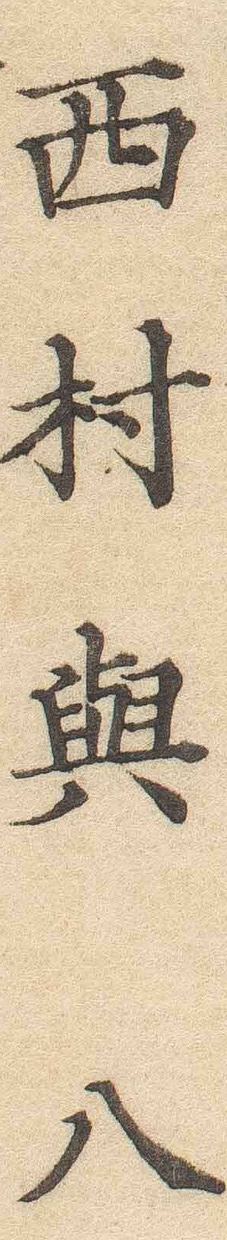西村與八
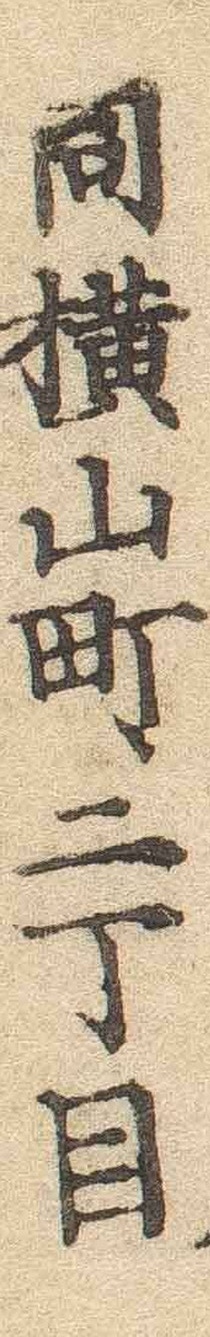同横山町二丁目
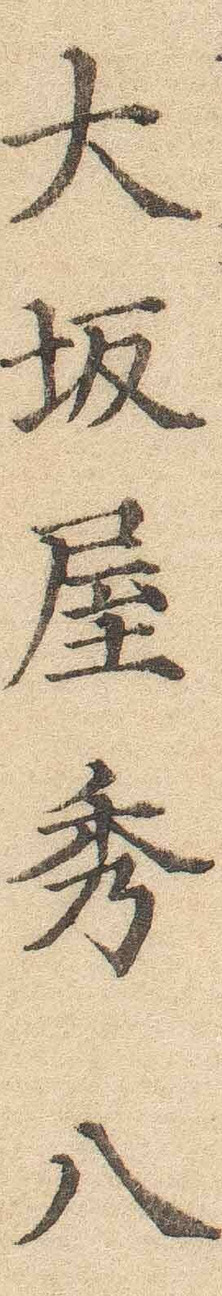大坂屋秀八
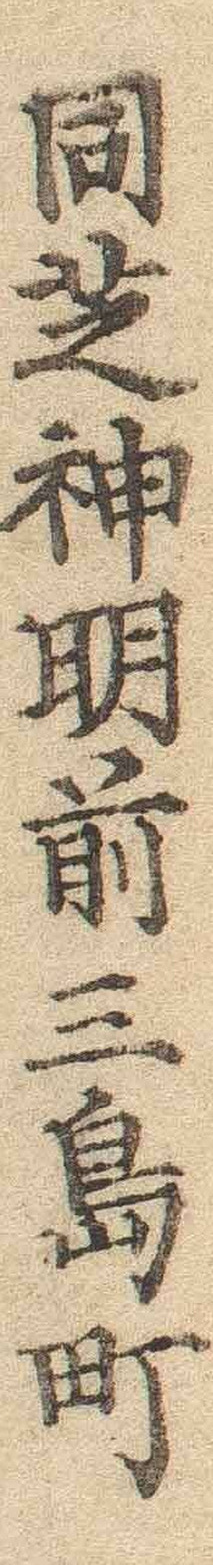同芝明神前三島町
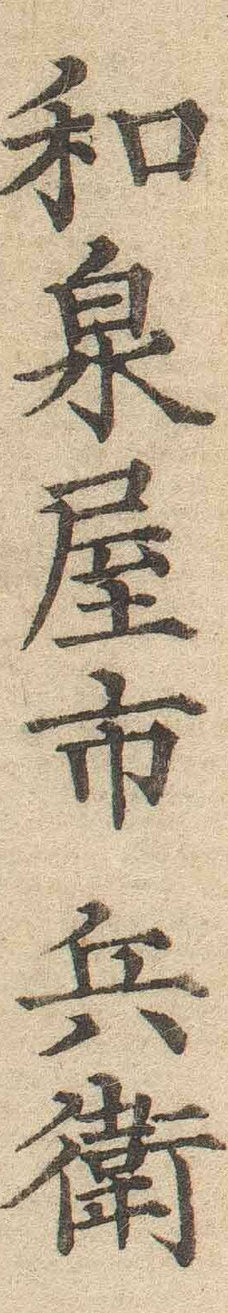和泉屋市兵衛
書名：四季漬物塩嘉言
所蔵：東京学芸大学附属図書館 国文学研究資料館
